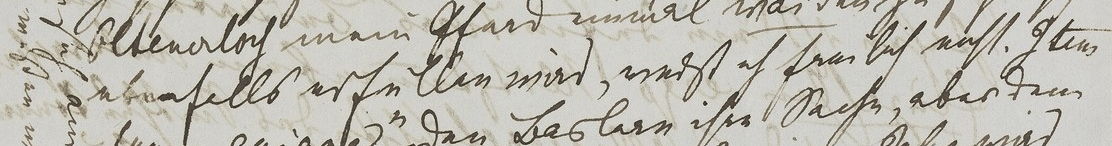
ebenfalls erfüllen wird, weiß ich freilich nicht. Item
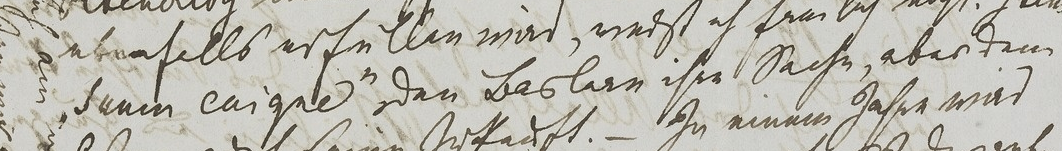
«suum cuique», den Baslern ihre Sache, aber dem
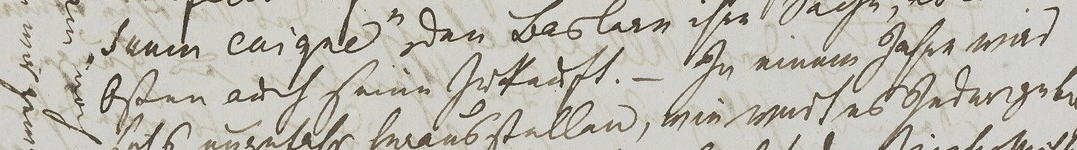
Osten auch seine Zukunft. – In einem Jahre wird
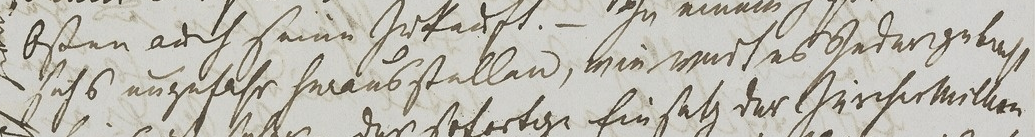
sichs ungefahr herausstellen, wie weit es Jeder gebracht.
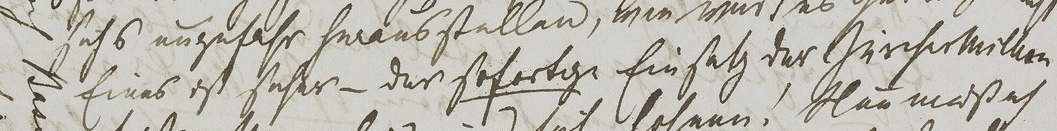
Eines ist sicher – der sofortige Einsatz der Zürcher Million
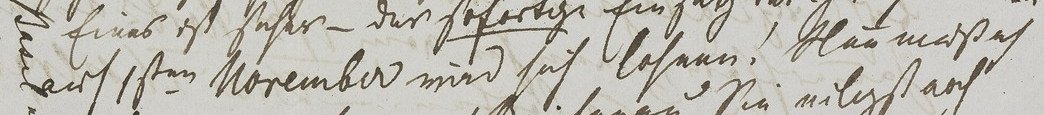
auf 1sten November wird sich lohnen! Nun muß ich
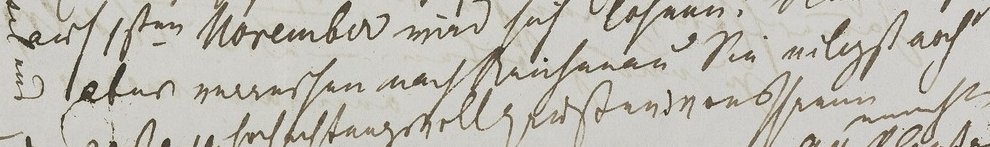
aber verreisen nach Reichenau Sie eiligst noch
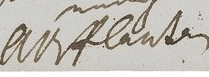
R v Planta
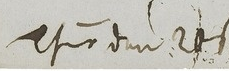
Chur den 20sten
